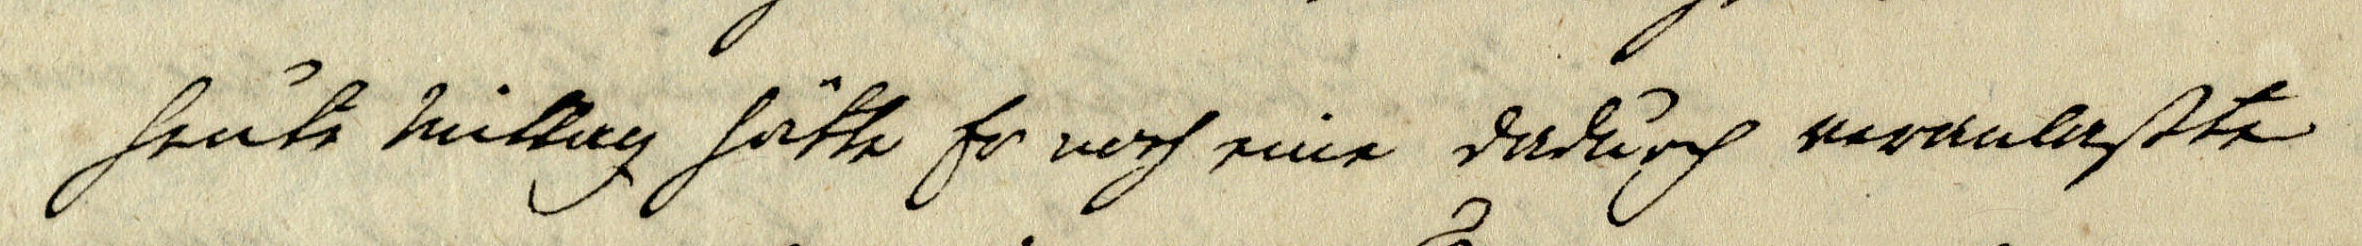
heute Mittag hätte Er noch eine dadurch veranlaßte
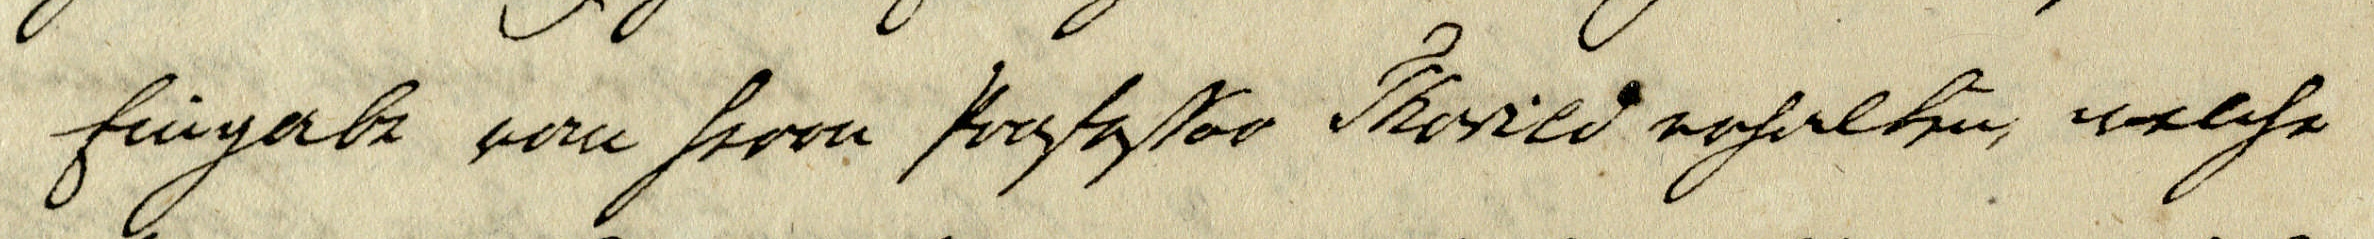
Eingabe vom Herrn Professor Thorild erhalten, welche
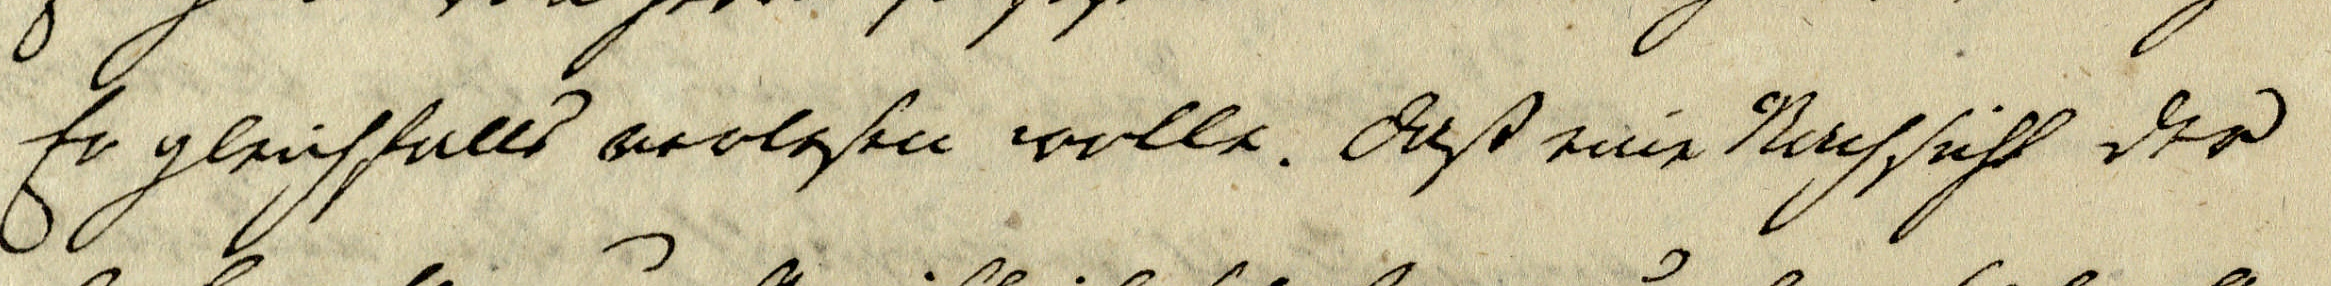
Er gleichfalls verlesen wolle. daß eine Nachsicht der
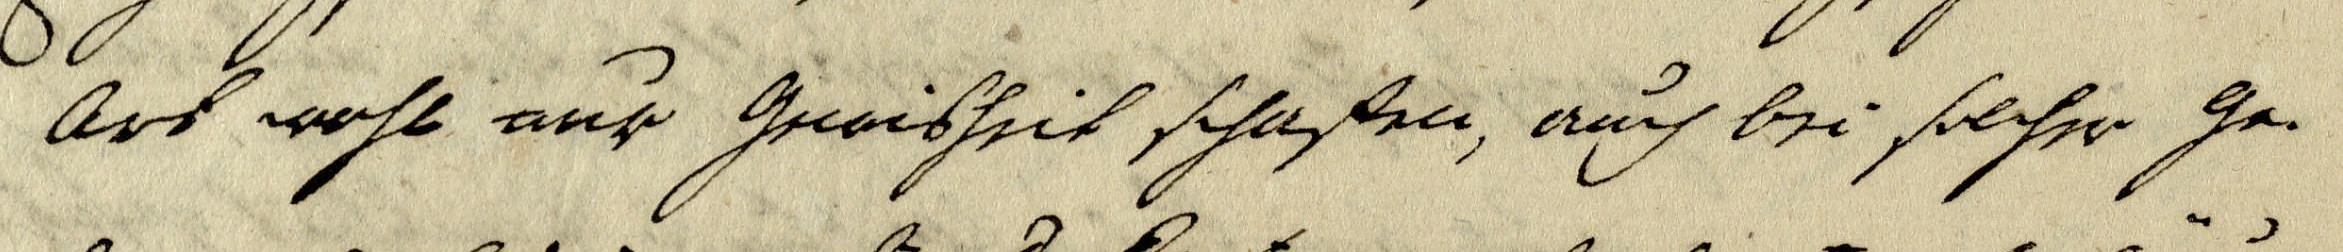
Art wohl nur Gewisheit schafen, auch bei solcher Ge¬
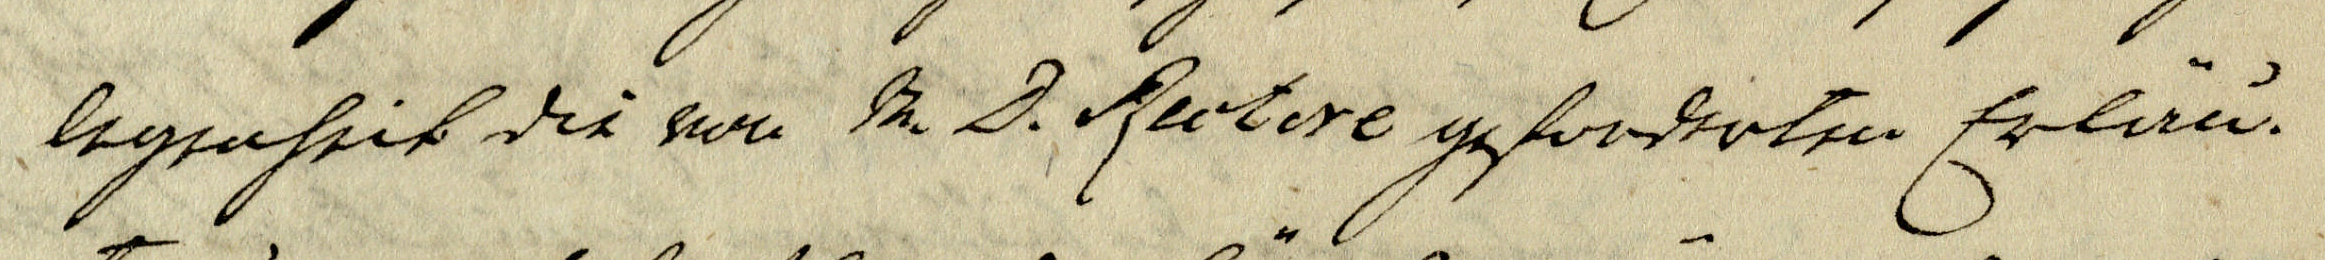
legenheit die von M. D. Rectore geforderten Erläu¬
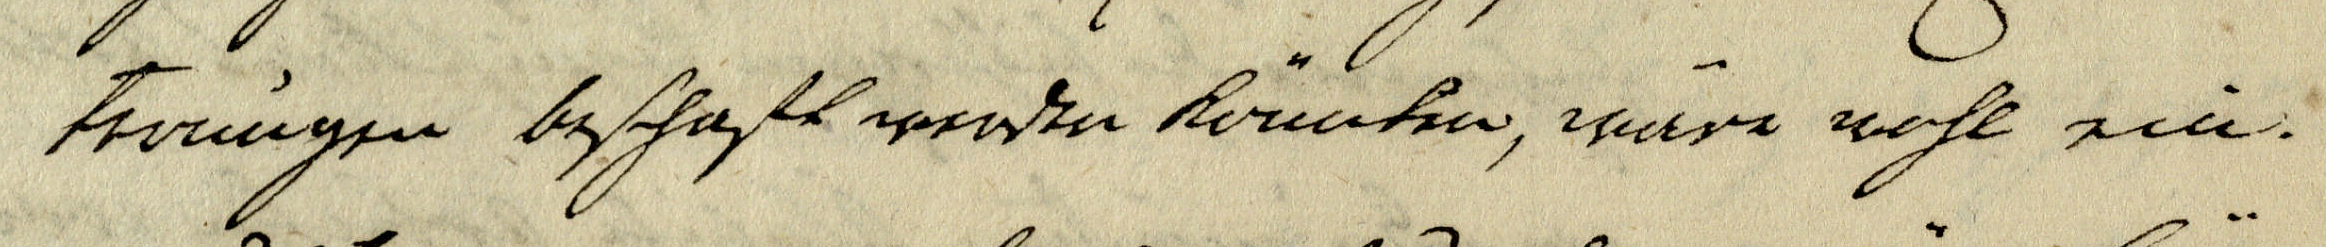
terungen beschaft werden könnten, wäre wohl ein¬
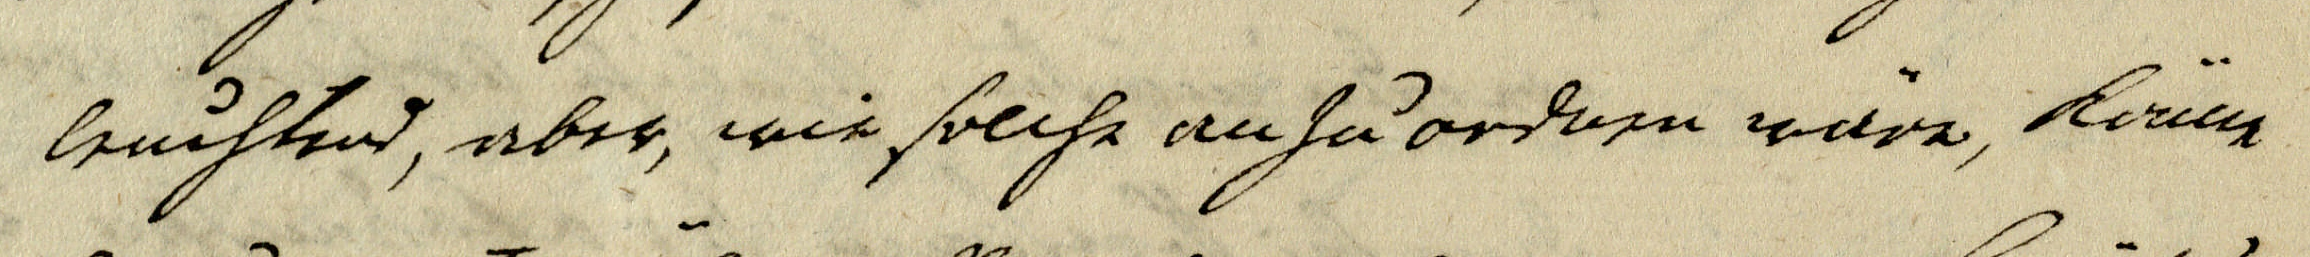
leuchtend, aber, wie solche anzuordnen wäre, könne
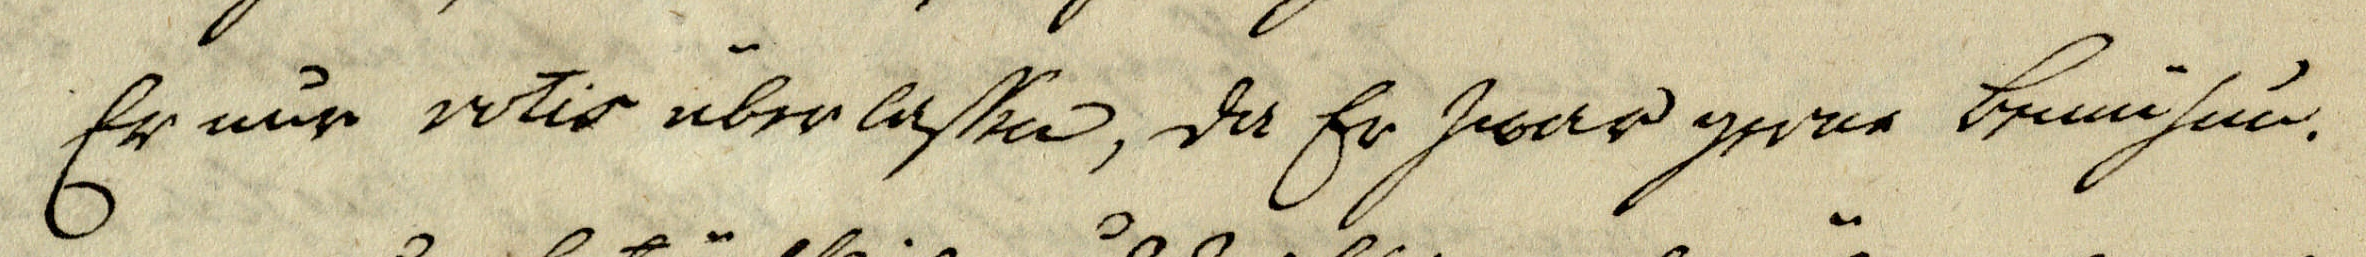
Er nur votis überlassen, da Er zwar gerne Bemühun¬
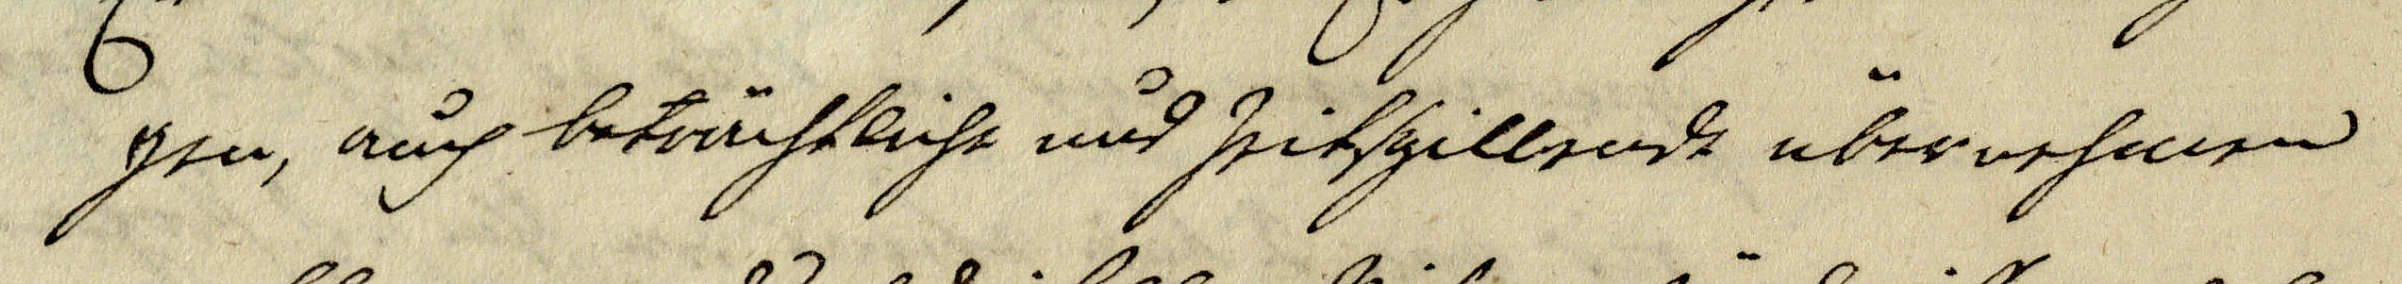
gen, auch beträchtliche und Zeitspillende übernehmen
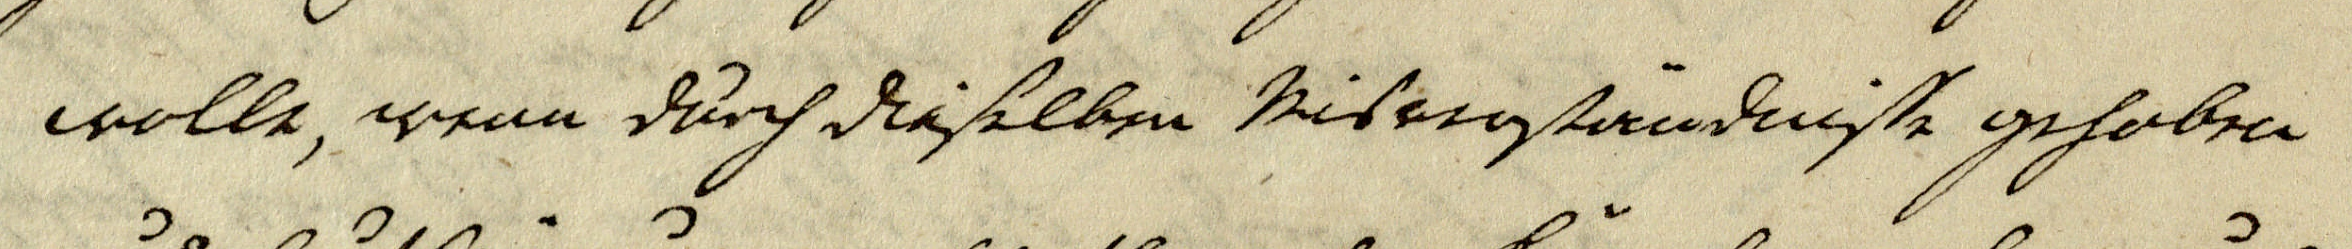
wolle, wenn durch dieselben Misverständnisse gehoben
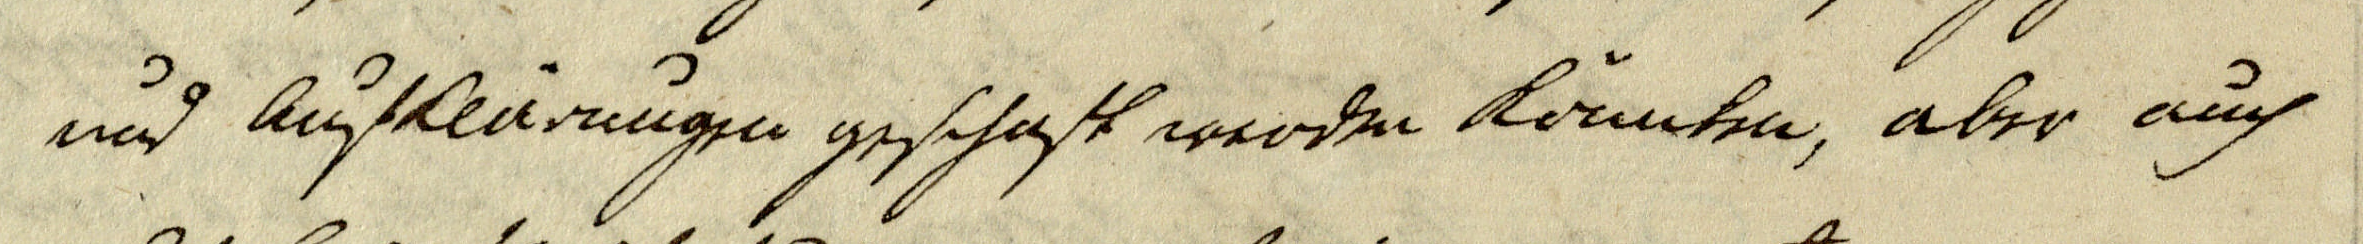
und Aufklärungen geschaft werden könnten, aber auch
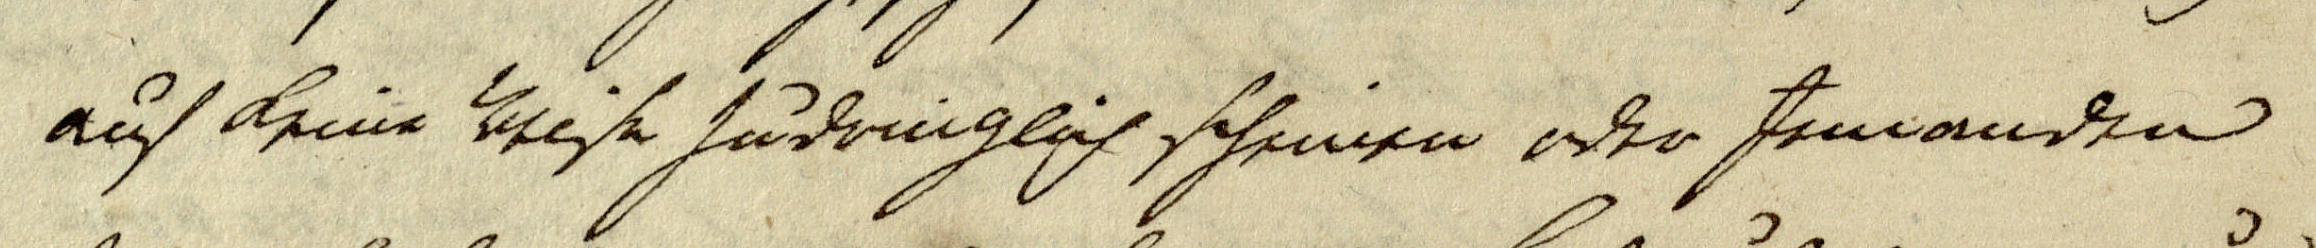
auf keine Weise zudringlich scheinen oder Jemanden
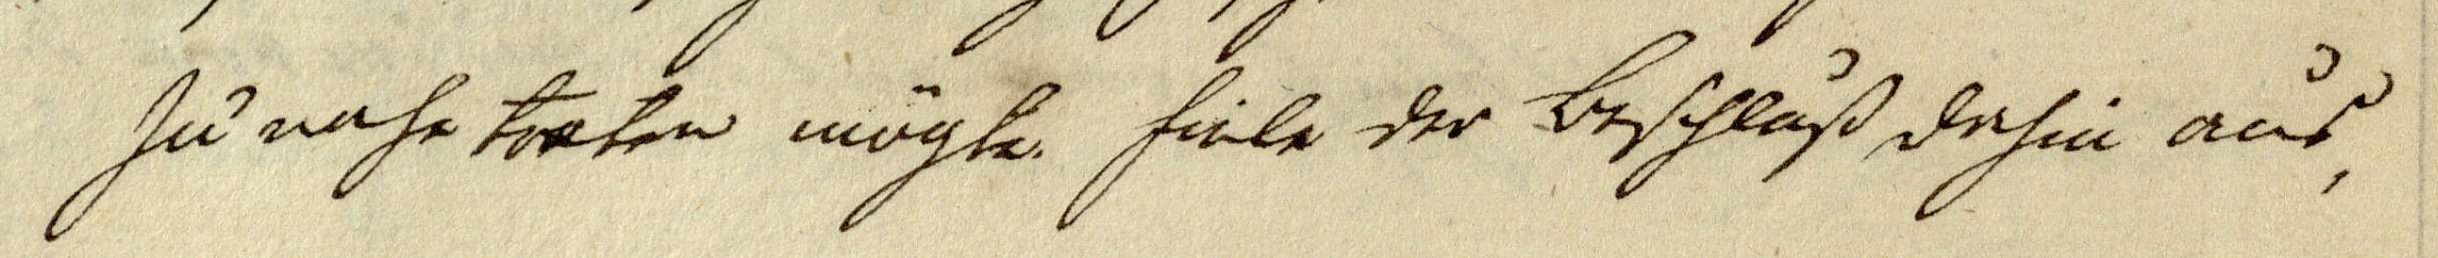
zu nahe treten mögte. Fiele der Beschluß dahin aus,
